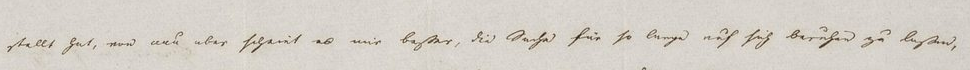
stellt hat, von nun aber scheint es mir besser, die Sache für so lange auf sich beruhen zu lassen,
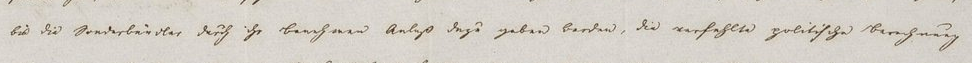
bis die Sonderbündler durch ihr benehmen Anlaß dazu geben werden, die verfehlte politische Berechnung
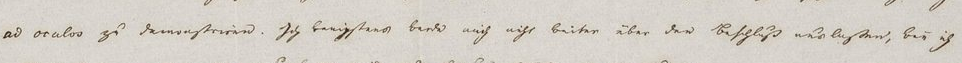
ad oculos zu demonstriren. Ich wenigstens werde mich nicht weiter über den Beschluß auslassen, wenn ich
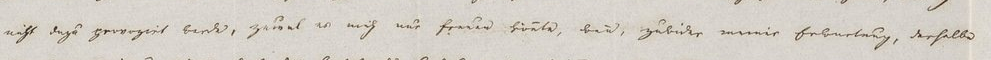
nicht dazu provozirt werde, zumal es mich nur freuen könnte, wenn, zuwider meiner Erwartung, derselbe
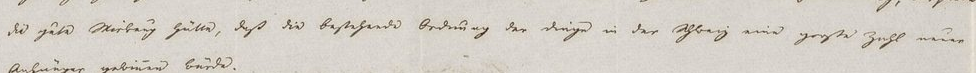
die gute Wirkung hätte, daß die bestehende Ordnung der Dinge in der Schweiz eine grosse Zahl neuer
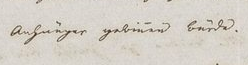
Anhänger gewinnen würde.
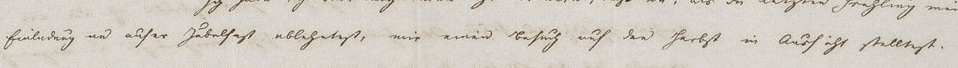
Einladung an unser Jubelfest ablehntest, mir einen Besuch auf den Herbst in Aussicht stelltest.
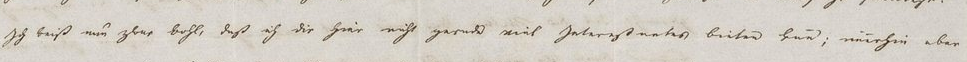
Ich weiß nun zwar wohl, daß ich Dir hier nicht gerade viel Interessantes bieten kann; immerhin aber
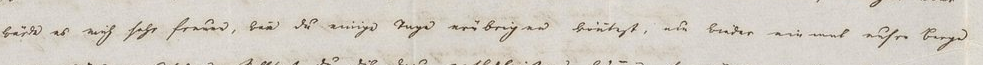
würde es mich sehr freuen, wenn Du einige Tage erübrigen könntest, um wieder einmal unsre Berge
